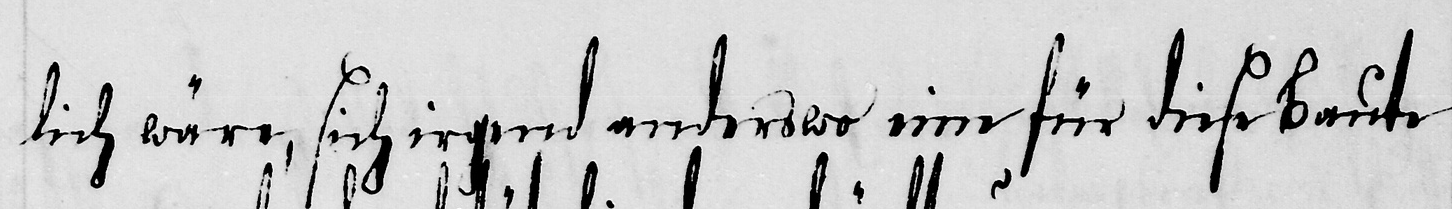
lich wäre, sich irgend anderswo eine für diese Baute
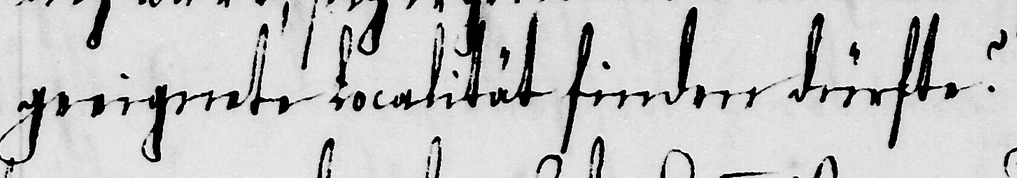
geeignete Localität finden dürfte?
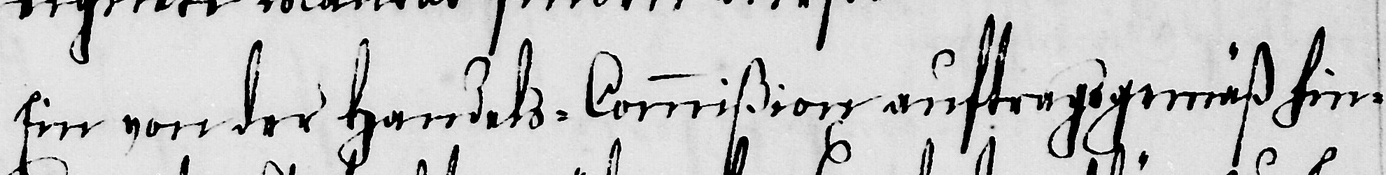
Ein von der Handels-Commißion auftragsgemäß hin¬
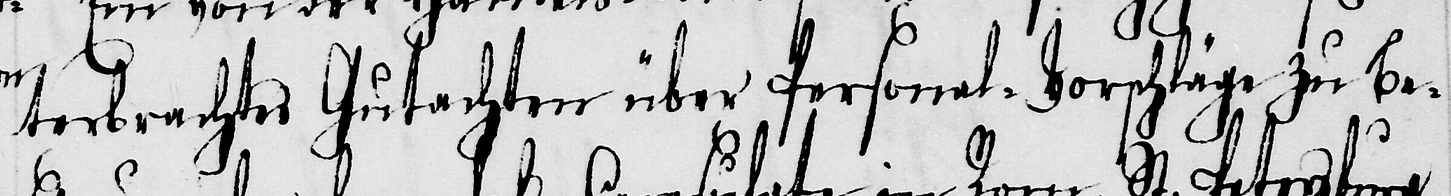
terbrachtes Gutachten über Personal-Vorschläge zu Bes¬
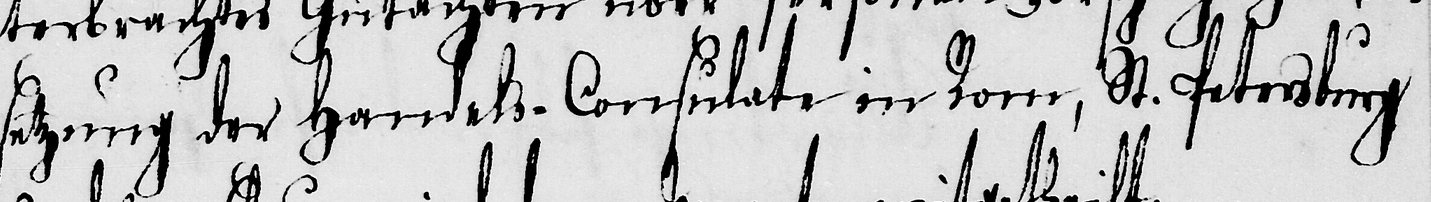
etzung der Handels-Consulate in Rom, St. Petersburg
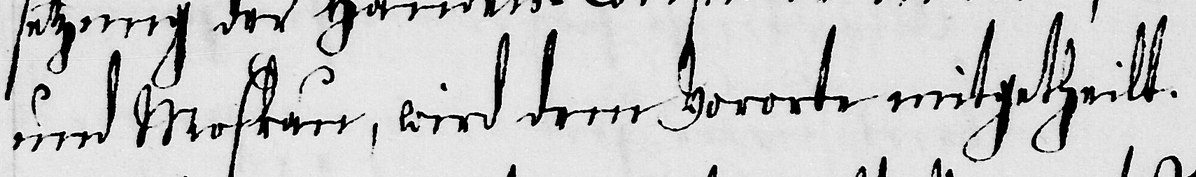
und Moskau, wird dem Vororte mitgetheilt.
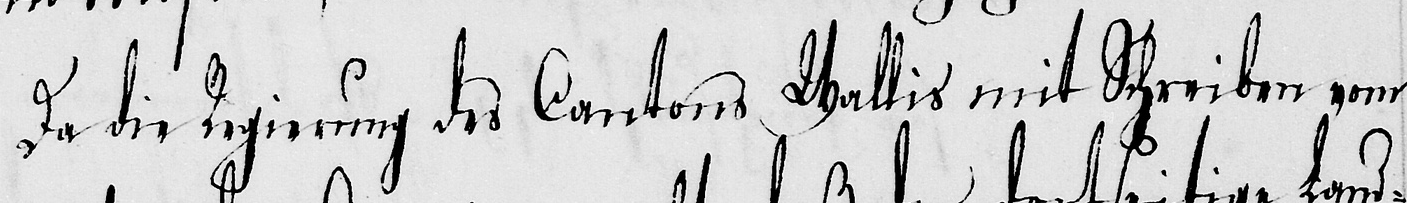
Da die Regierung des Cantons Wallis mit Schreiben vom
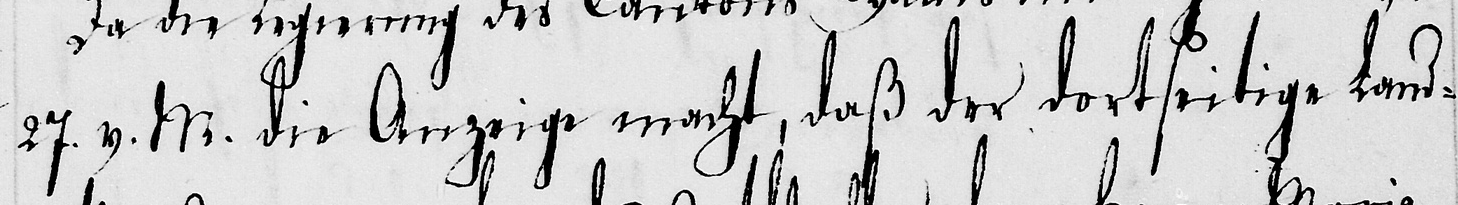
27. v. M. die Anzeige macht, daß der dortseitige Land¬
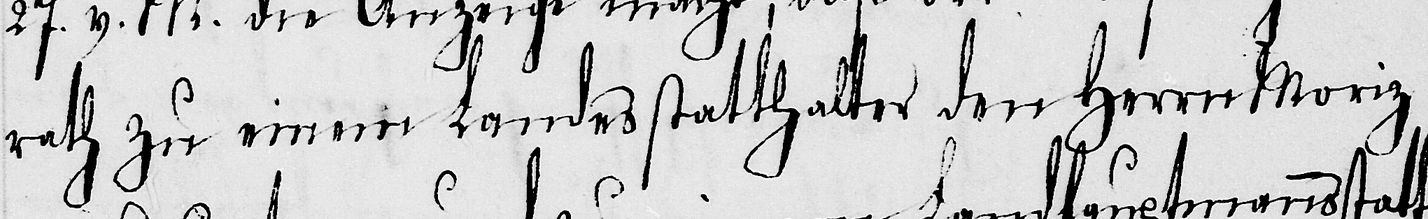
rath zu einem Landesstatthalter den Herrn Moriz
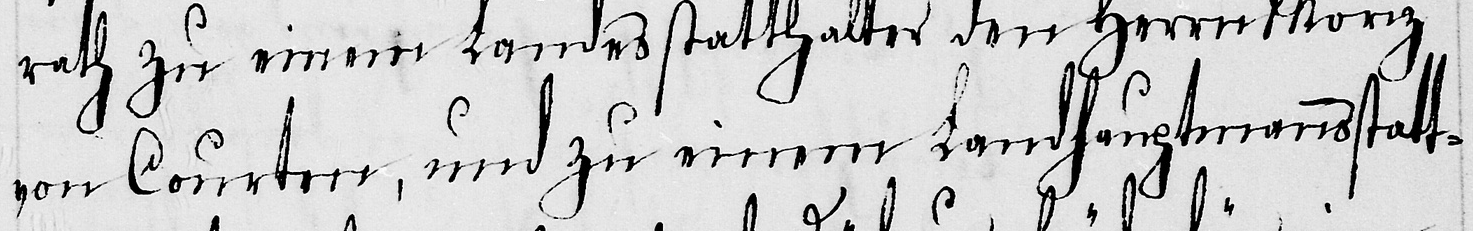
von Courten, und zu einem Landhauptmannstat¬
